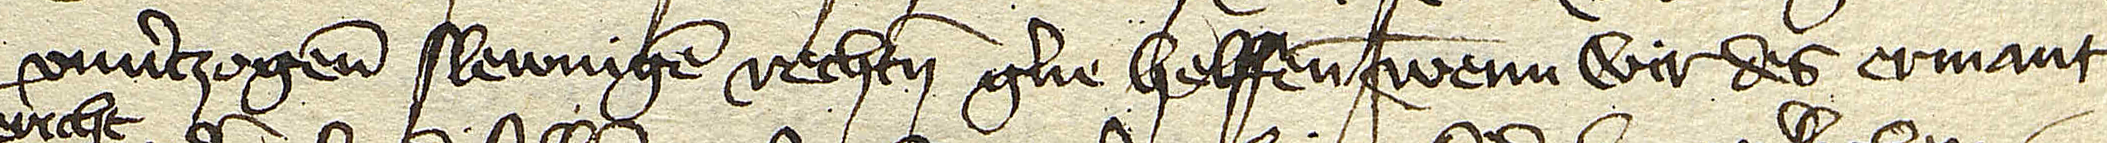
vnu*cʒogen* ſlewnige* rechtn* g*ne helffen wenn wir des ermant
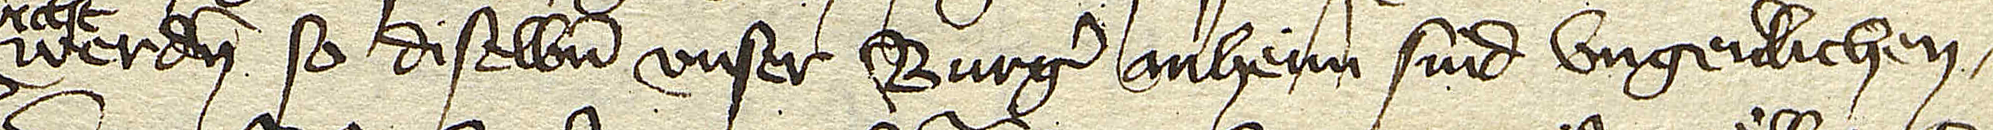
werdn* ſo diſelbn* vnſer Burg* anheim ſind vngeu*lichen /
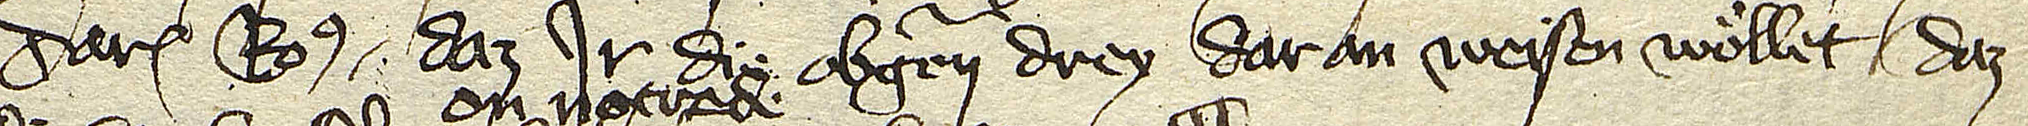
Dar* Ro* / daʒ Ir die obgen* drey daran weiſen wöllet / daʒ
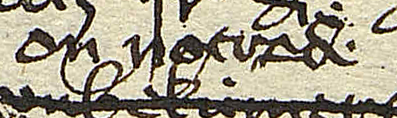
on notrede
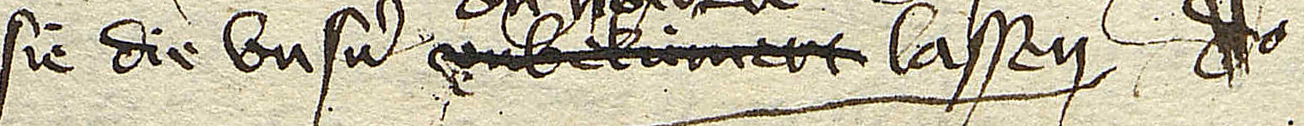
ſie die vnſn* vnbekümert laſſen do
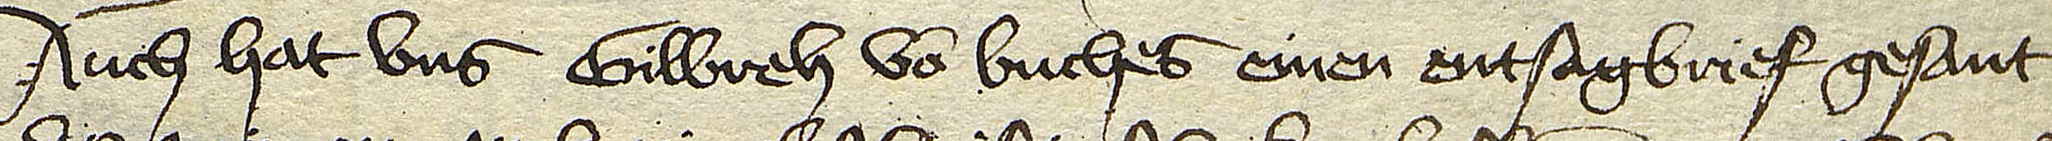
Auch hat vns Gilbrech vo* buches einen entſagbrief geſant
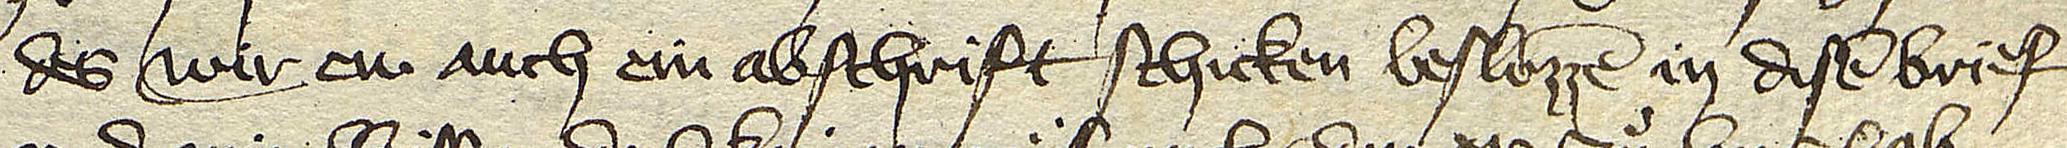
des wir ew auch ein abſchrift ſchicken beſloʒʒe* in diſe* brief
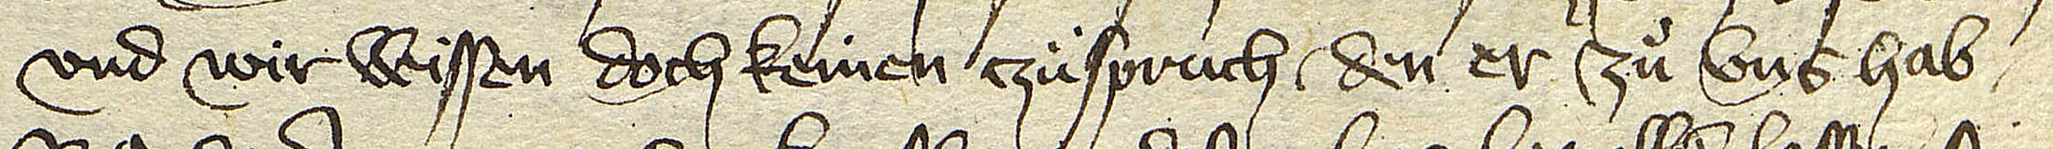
vnd wir wiſſen doch keinen cʒüſpruch / den er cʒü vns hab /
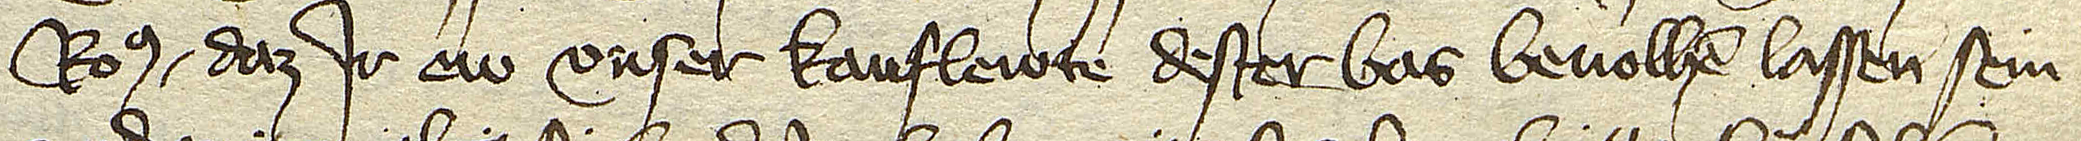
Ro* / daʒ Ir ew vnſer kauflewte deſter bas beuolhe* laſſen ſein
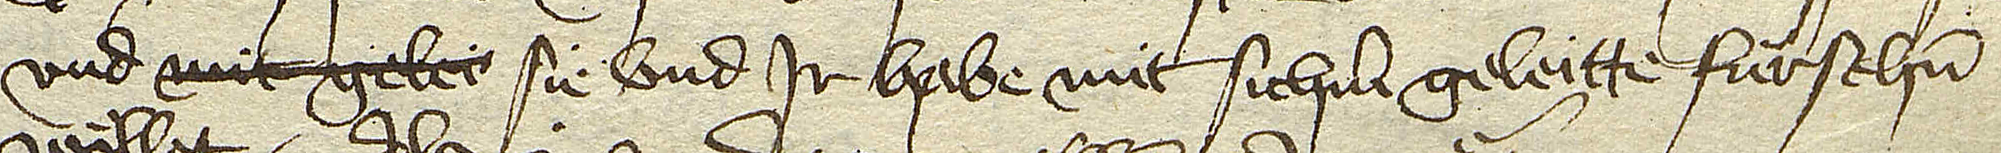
vnd mit gelei ſie vnd Ir habe mit ſichm* geleitte fürſehn*
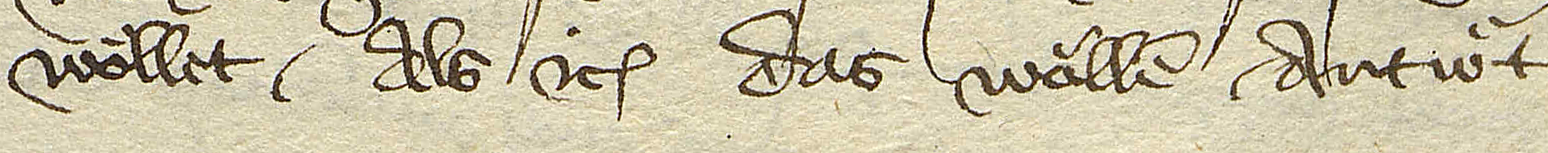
wöllet / Als ec* Das wölle* / Antw*t
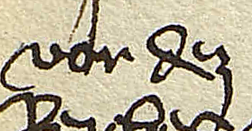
vor deʒ
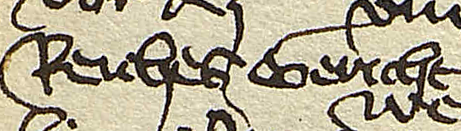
Reiches Gericht
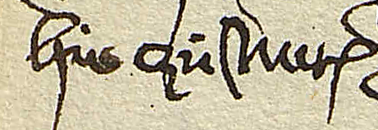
hie cʒü Nur*
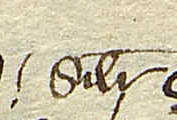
/ Silr*
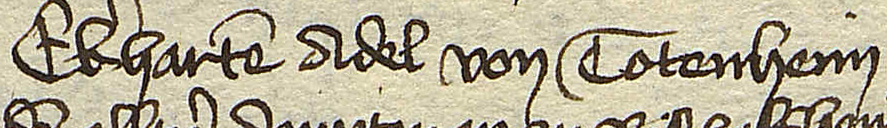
Eb*harte* Adel von Totenheim
